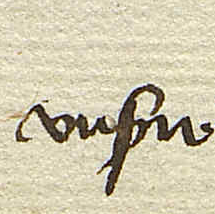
vnſ*n
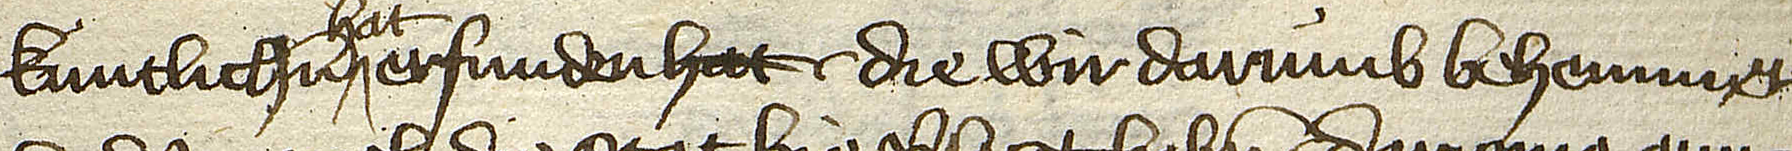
küntlich*n erfunden hat / die wir darümb behemmet
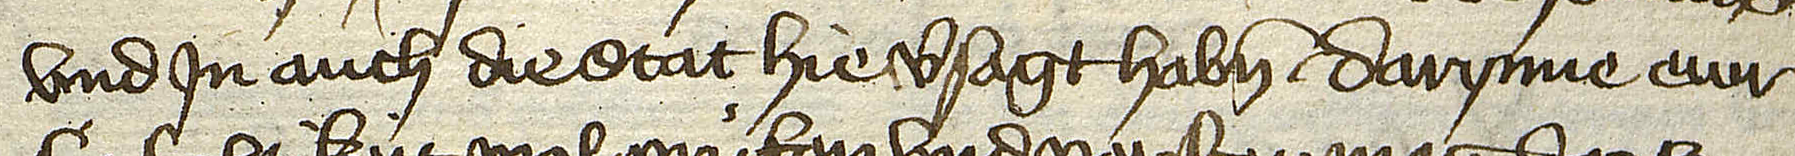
vnd In auch die Stat hie v*ſagt hab*n / darynne ewr
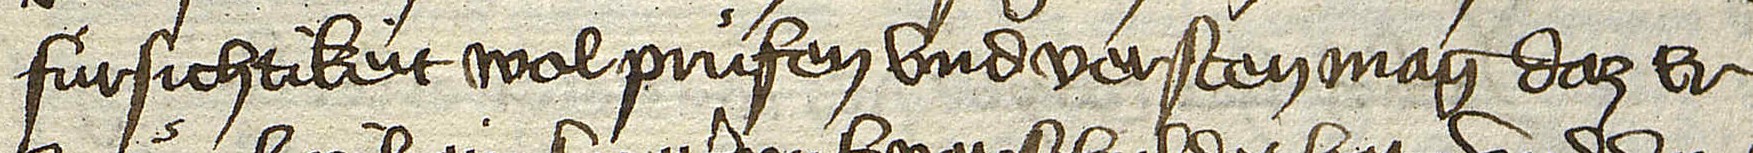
fürſichtikeit wol prüfen vnd verſten mag daʒ Er
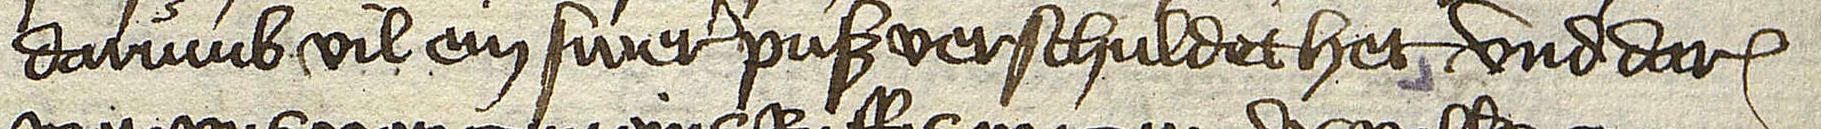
darümb vil ein ſwer* puſʒ verſchuldet het Vnd dar*
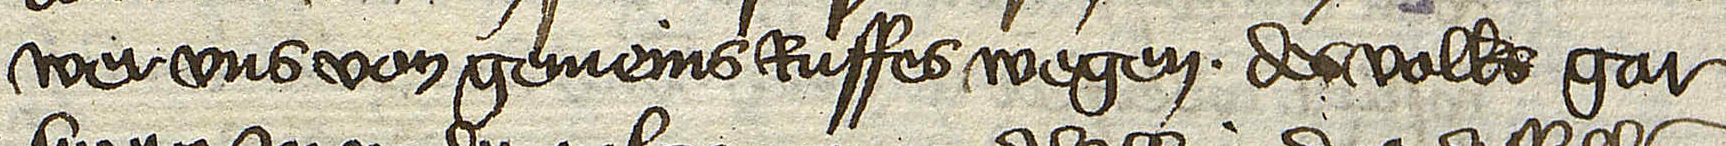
wer vns von gemeins Ruffes wegen . des volks gar
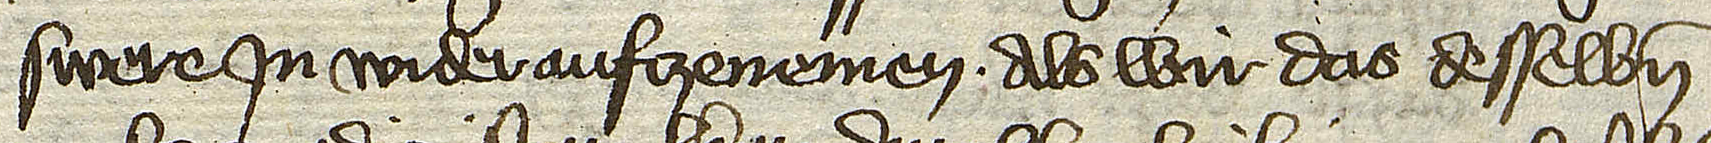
ſwere In wider aufcʒenemen . Als wir das deſſelb*n
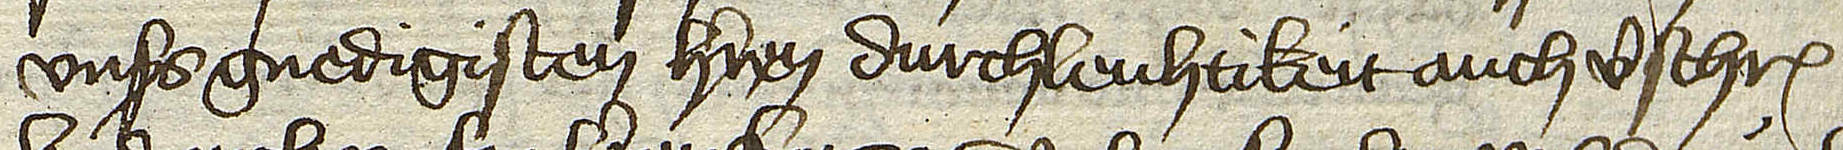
vnſ*s gnedigiſten h*ren durchleuhtikeit auch v*ſchr*
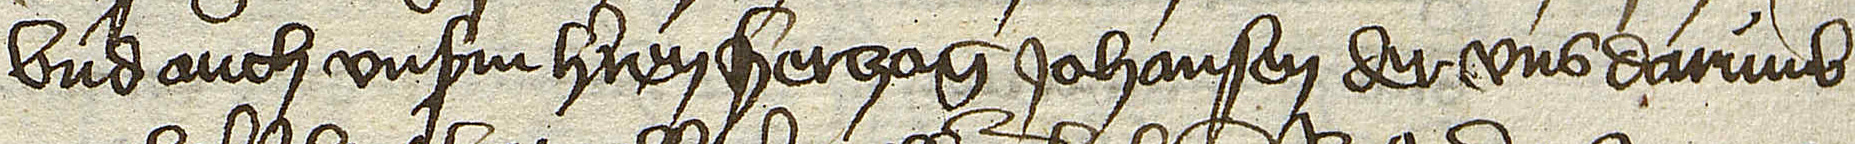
vnd auch vnſ*m h*ren hercʒog Iohanſen der vns darümb
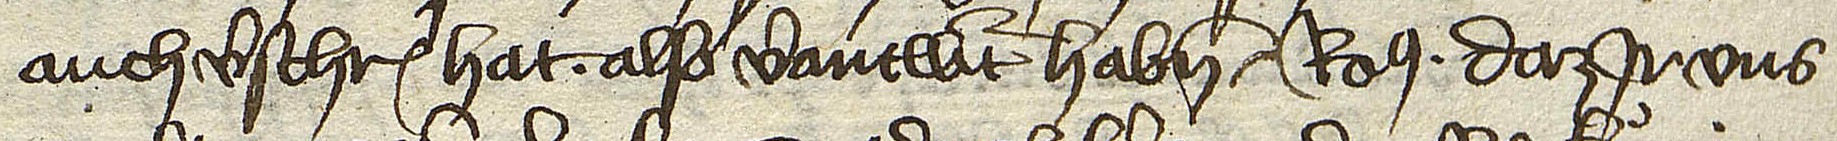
auch v*ſchr* hat . alſo v*antw*t hab*n / Ro* . daʒ Ir vns
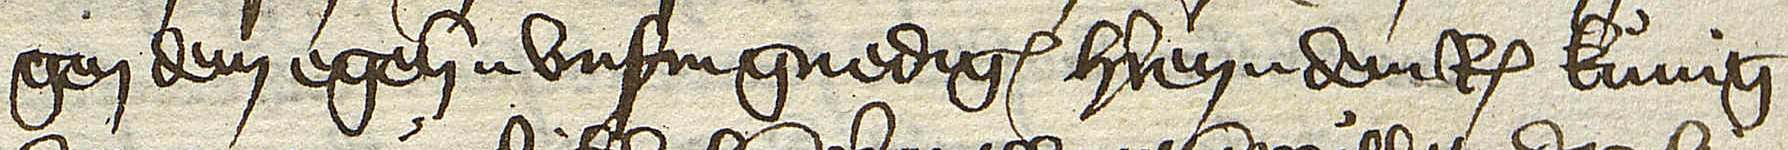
gen dem egen* ~ vnſ*m gnedig* h*ren ~ dem R* künig
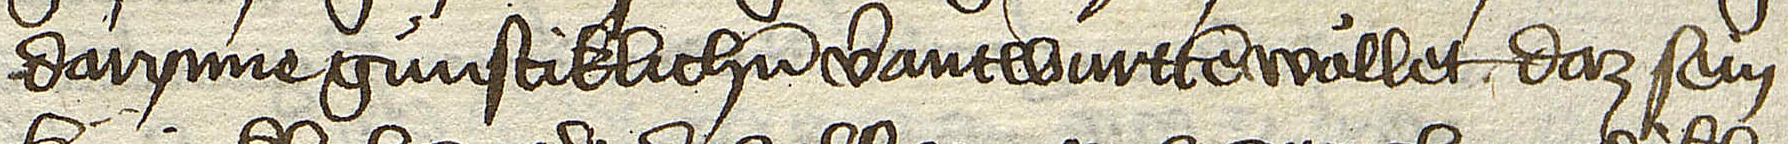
darynne günſtiklich*n v*antwurtte* wöllet / daʒ ſein
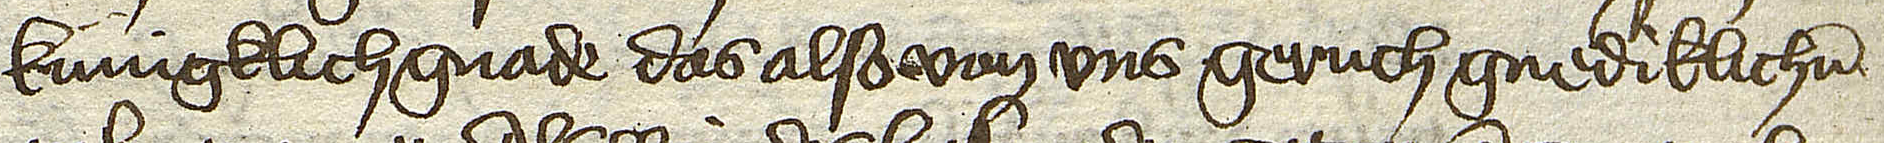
künigklich gnade das alſo von vns geruch gnediklich*n
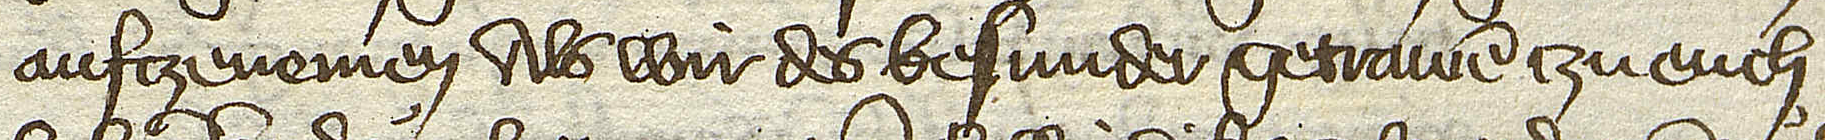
aufcʒenemen Als wir des beſunder getrawe* cʒu euch
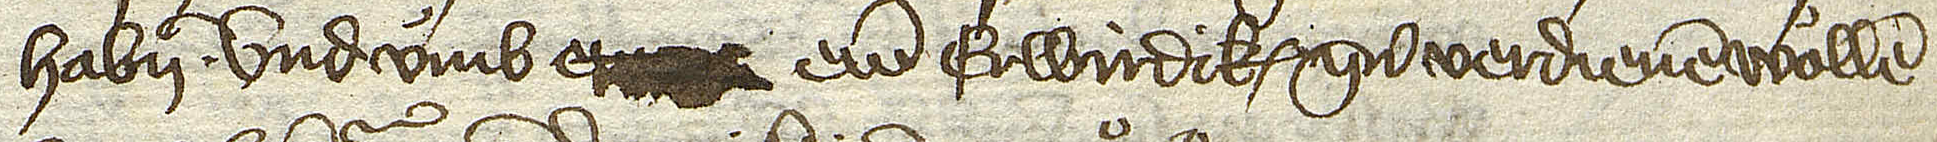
hab*n . Vnd mb e%%% ew* Erwirdik* g*n verdiene* wölle*
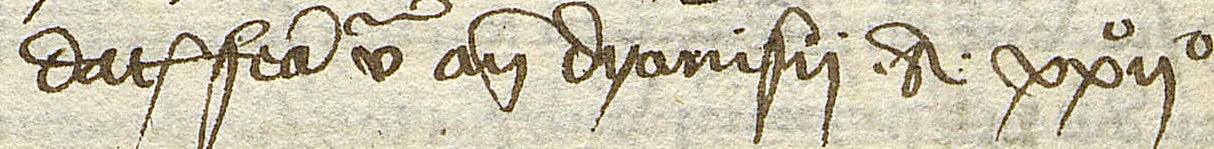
dat* fea* v* an* dyoniſii . A . xxii*
